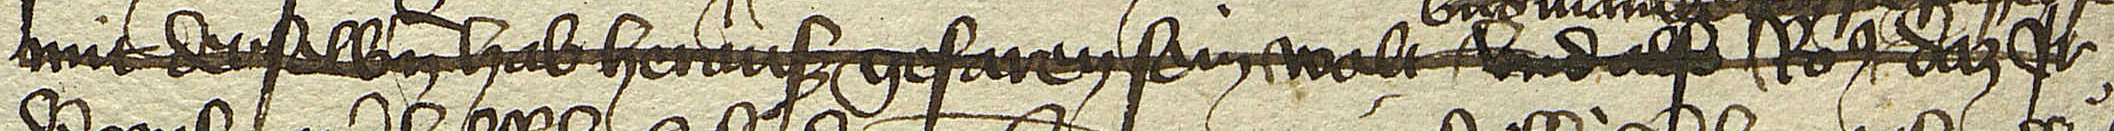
mit denſelbn* hab herauſʒ gefaren ſein wolt / vnd alſo Ro* / daʒ Ir
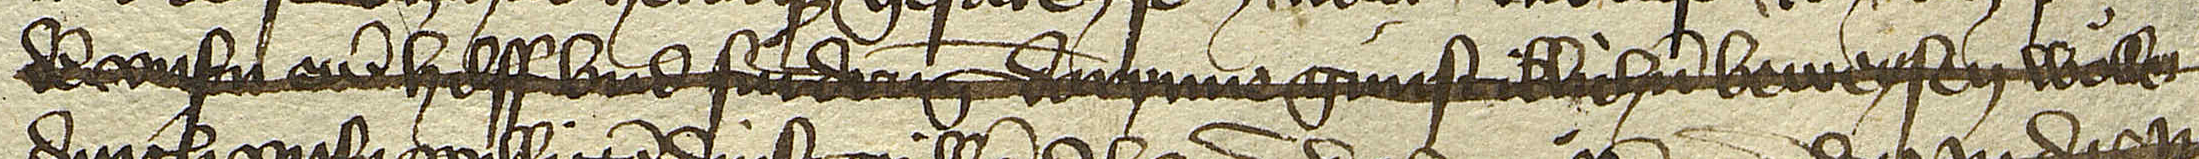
de* vnſ*n ew* hilff vnd fürdrug* darynne günſiklichn* beweyſen wöllet
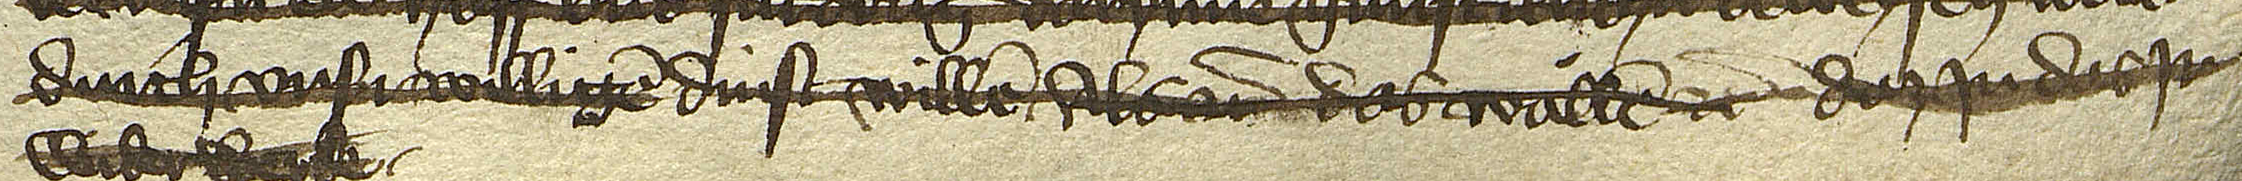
durch vnſ*r willige* dinſt wille* / Als ec* das wölle* ec* daʒ In das Ir
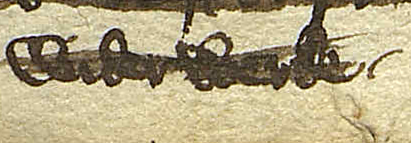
wider werde /
